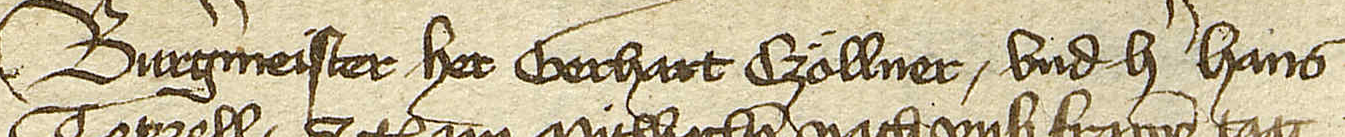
Burg*meiſter her Gerhart Cʒöllner / vnd h* hans
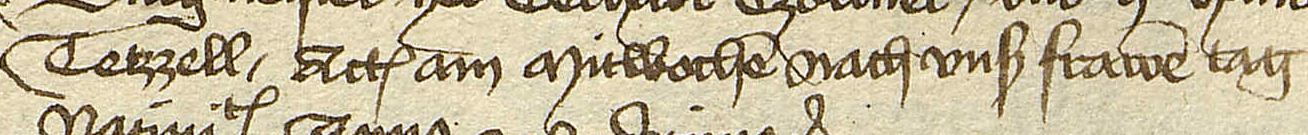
Tetʒʒell / Act* am Mitwoche* nach vnſ* frawe* tag
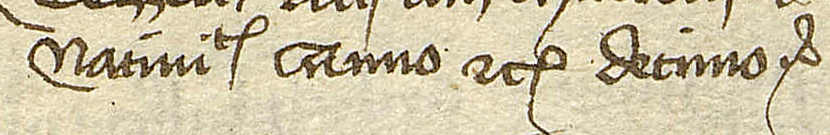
Natiui* Anno ec* decimo §
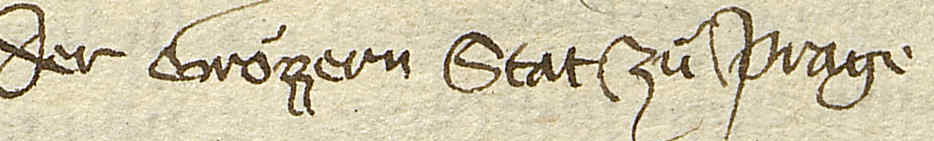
Der Gröʒʒern Stat cʒü Prage
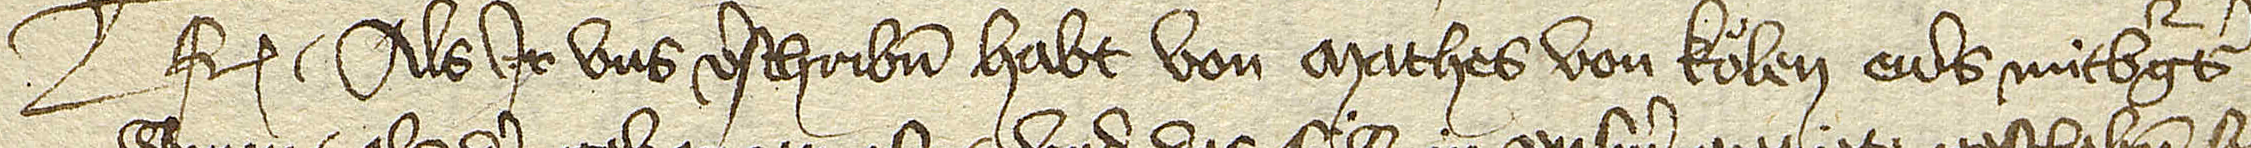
L* fr* / Als Ir vns v*ſchribn* habt von Mathes von kölen ew*s mitb*gs*
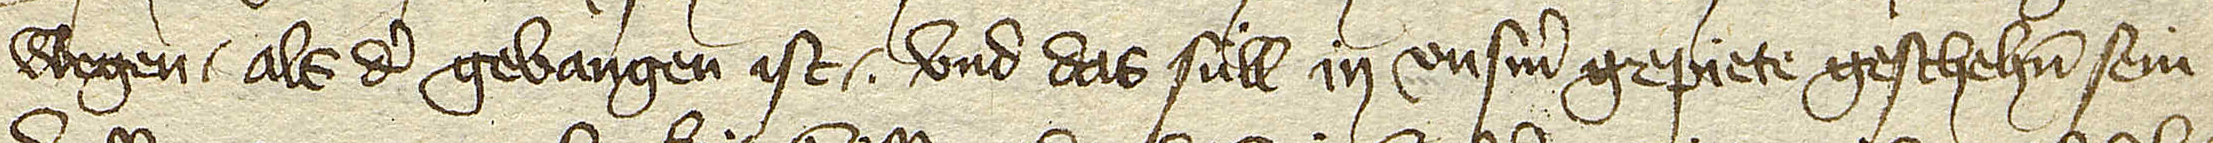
wegen / als d* gevangen iſt / . vnd das ſüll in vnſm* gepiete geſchehn* ſein
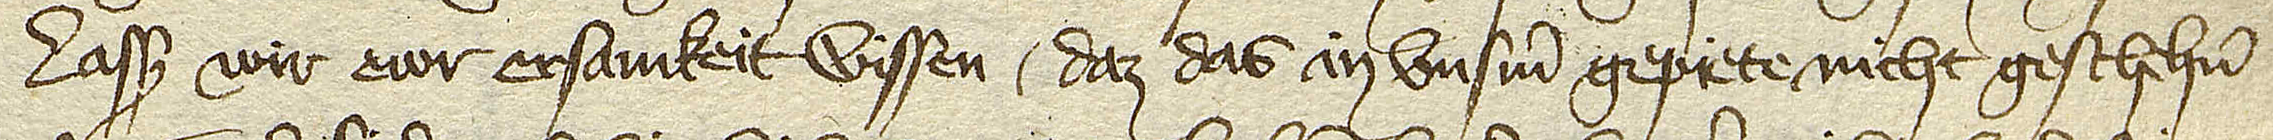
Laſſ* wir ewr erſamkeit wiſſen / daʒ das in vnſm* gepiete nicht geſchehn*
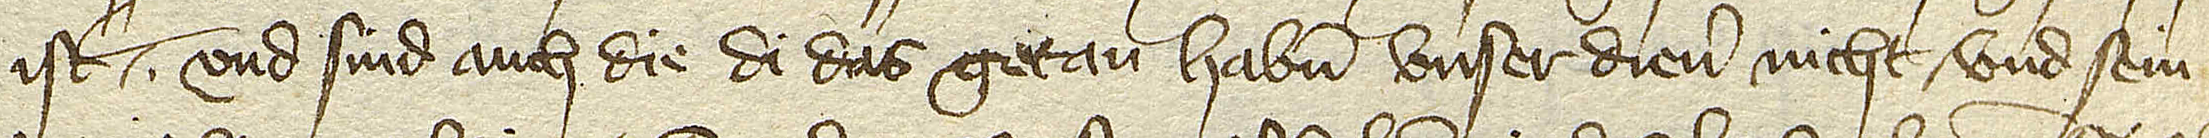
iſt / . vnd ſind auch die di das getan habn* vnſer dien* nicht / vnd ſein
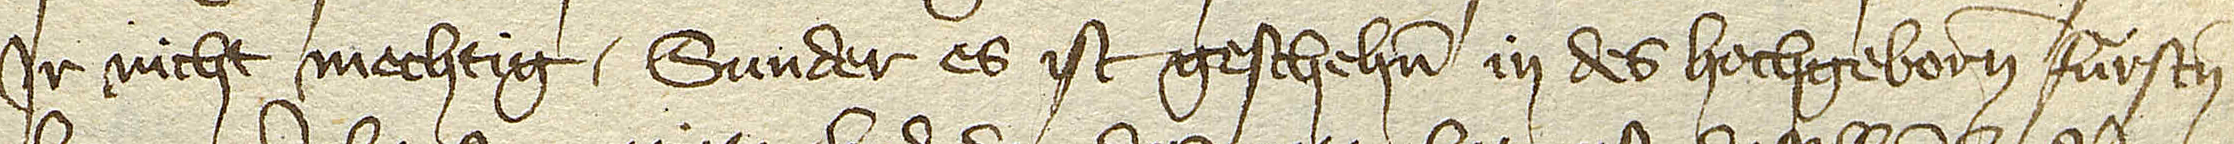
Ir nicht mechtig / Sunder es iſt geſchehn* in des hochgeborn* fürſtn*
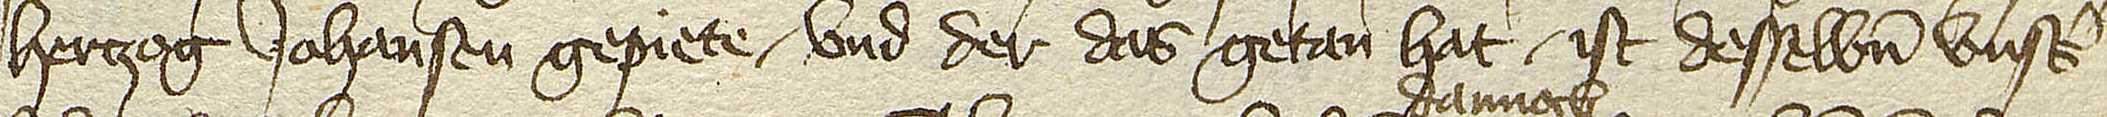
hercʒog Iohanſen gepiete / vnd der das getan hat / iſt deſſelbn* vnſs*
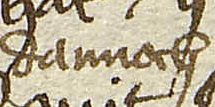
dannoch
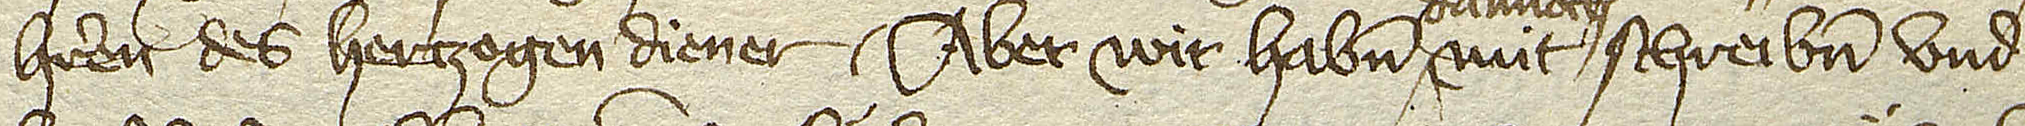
hr*en des hercʒogen diener / Aber wir habn* mit ſchreibn* vnd
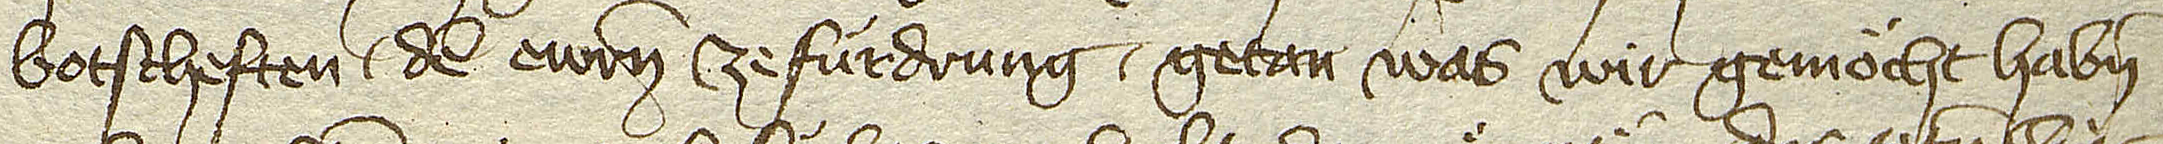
botſcheften / de* ewrn* cʒe fürdrung / getan was wir gemöcht habn*
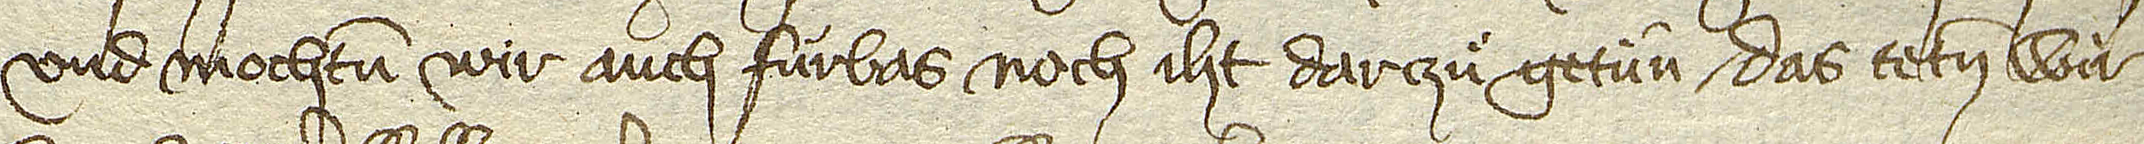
vnd mochtn* wir auch fürbas noch iht darcʒü getün / das tetn* wir
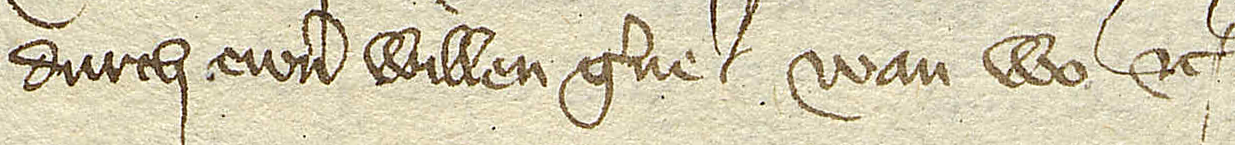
durch ewn* willen g*ne / wan wo ec*
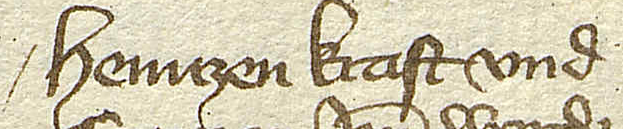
heincʒen kraft vnd
